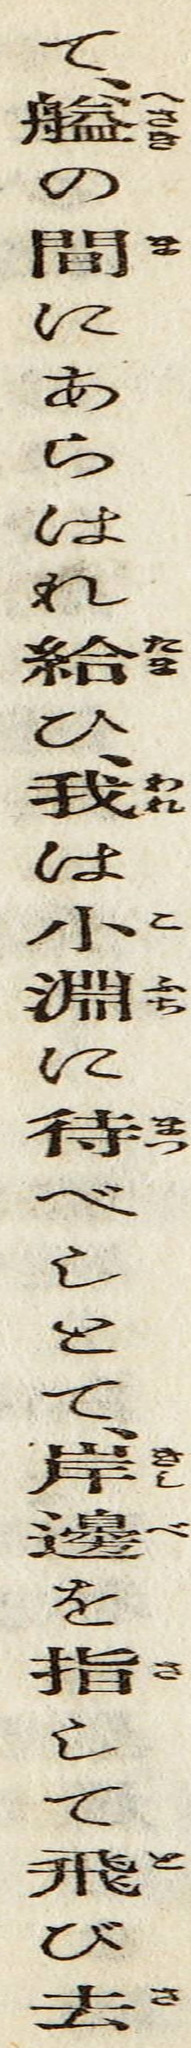て、艗の間にあらはれ給ひ、我は小淵に待べしとて、岸辺を指して飛び去
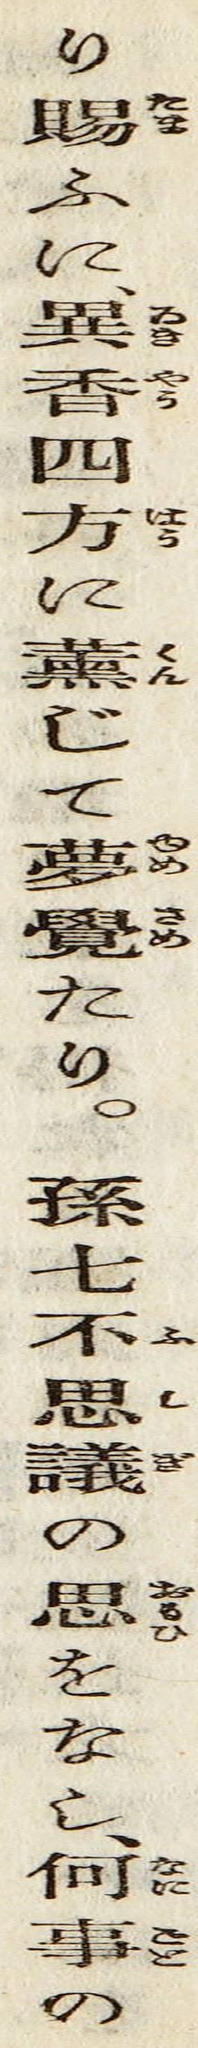り賜ふに、異香四方に薫じて夢覚たり。孫七不思議の思をなし、何事の
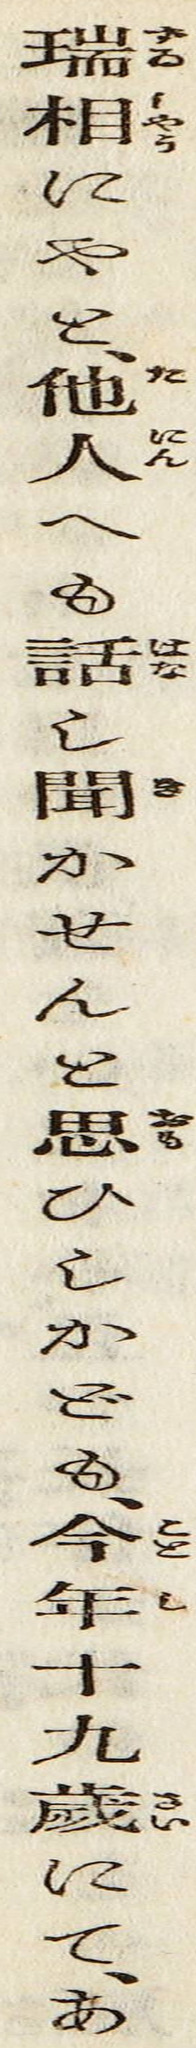瑞相にやと、他人へも話し聞かせんと思ひしかども、今年十九歳にて、あ
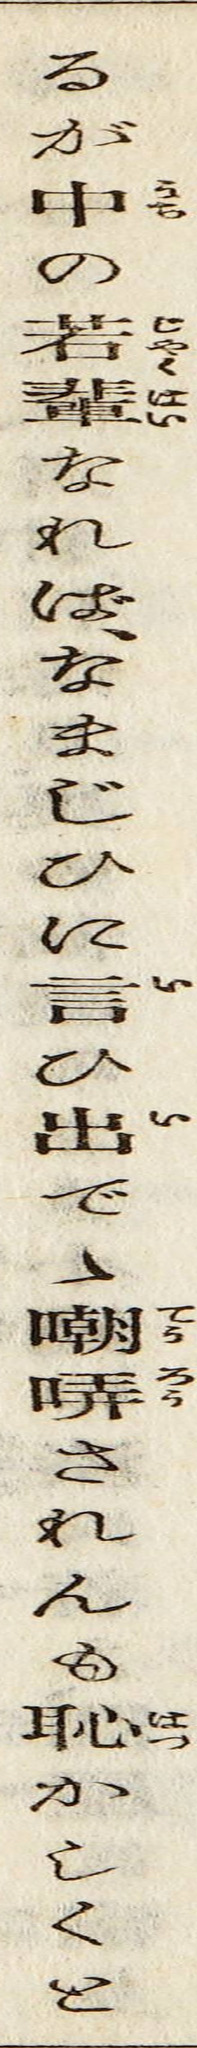るが中の若輩なれば、なまじひに言ひ出でゝ嘲哢されんも恥かしくと
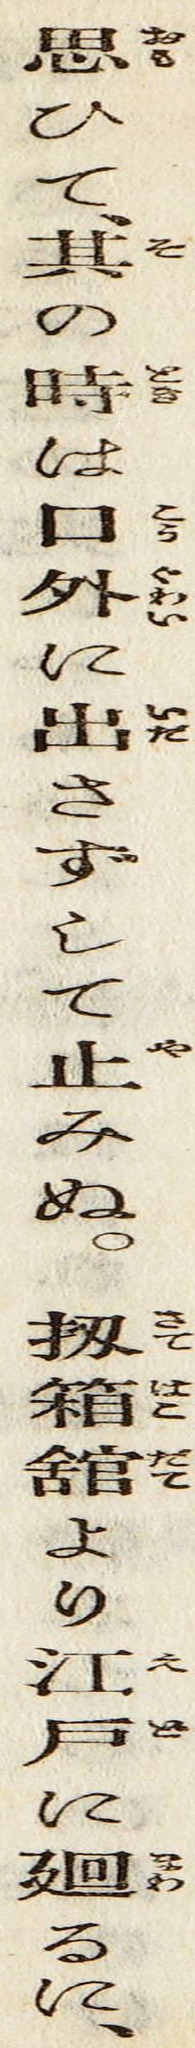思ひて、其の時は口外に出さずして止みぬ。扨箱館より江戸に廻るに、
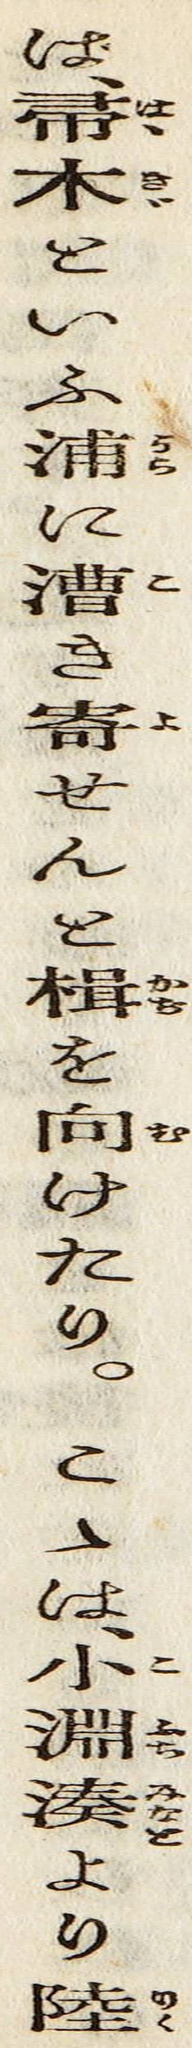ば、帚木といふ浦に漕き寄せんと楫を向けたり。こゝは、小淵湊より陸
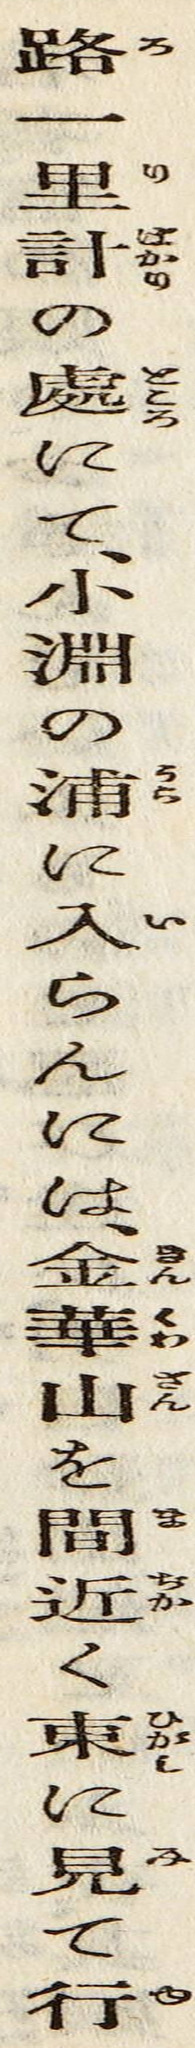路一里計の処にて、小淵の浦に入らんには、金華山を間近く東に見て行
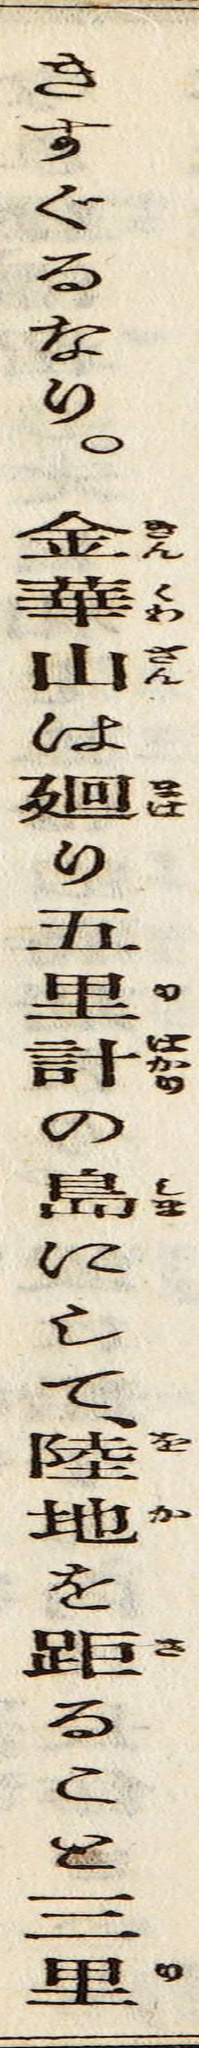きすぐるなり。金華山は廻り五里計の島にして、陸地を距ること三里
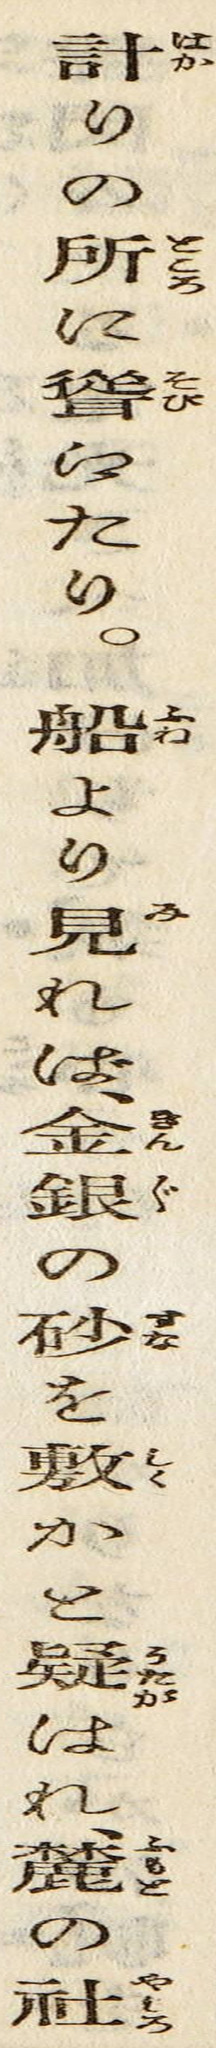計りの所に聳えたり。船より見れば、金銀の砂を敷かと疑はれ、麓の社
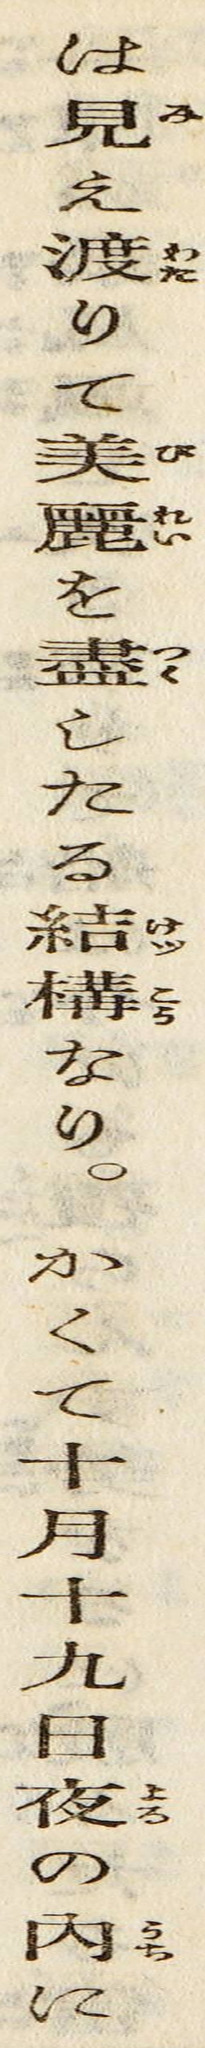は見え渡りて美麗を尽したる結構なり。かくて十月十九日夜の内に
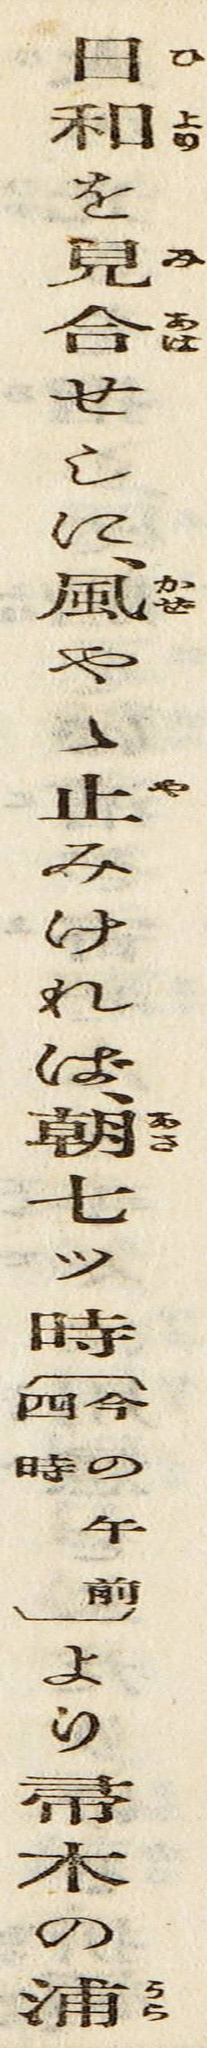日和を見合せしに、風やゝ止みければ、朝七ツ時[今の午前四時]より帚木の浦
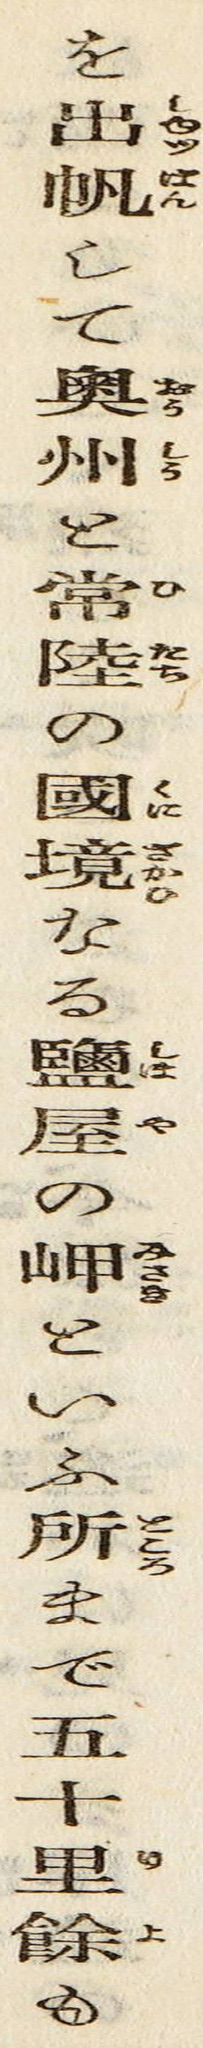を出帆して奥州と常陸の国境なる塩屋の岬といふ所まで五十里余も
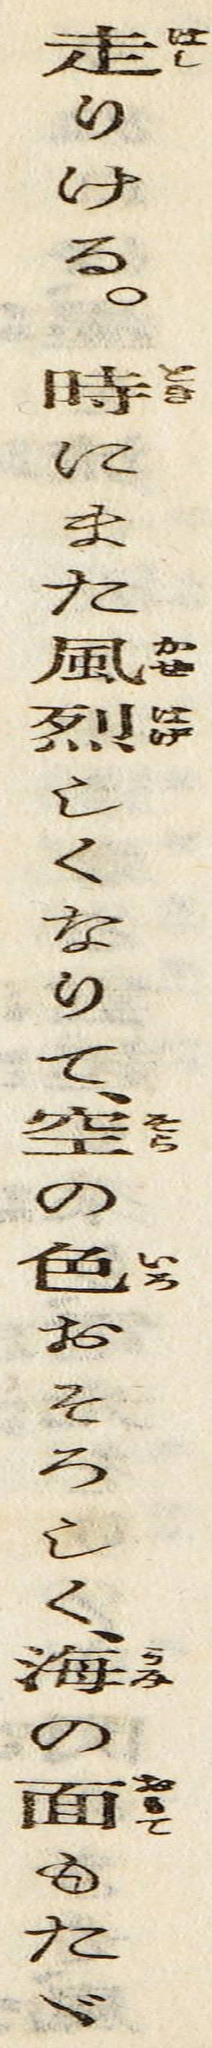走りける。時にまた風烈しくなりて、空の色おそろしく、海の面もたヾ
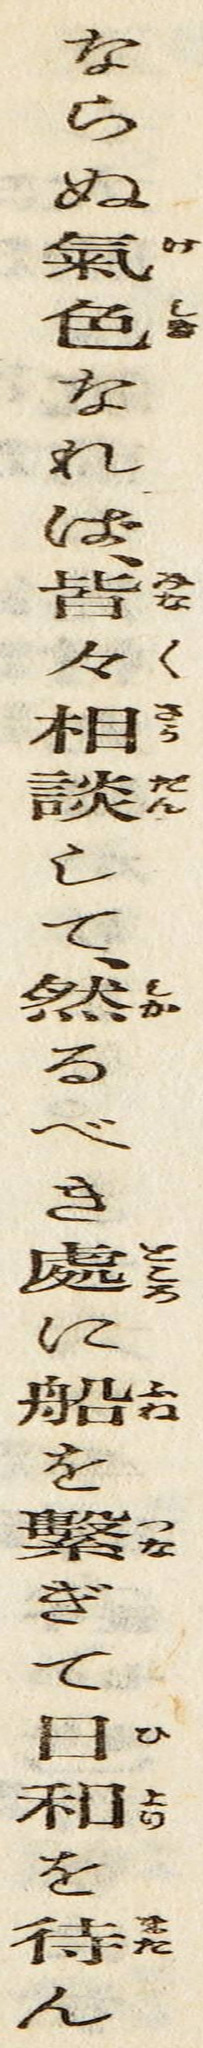ならぬ気色なれば、皆々相談して、然るべき処に船を繋ぎて日和を待ん
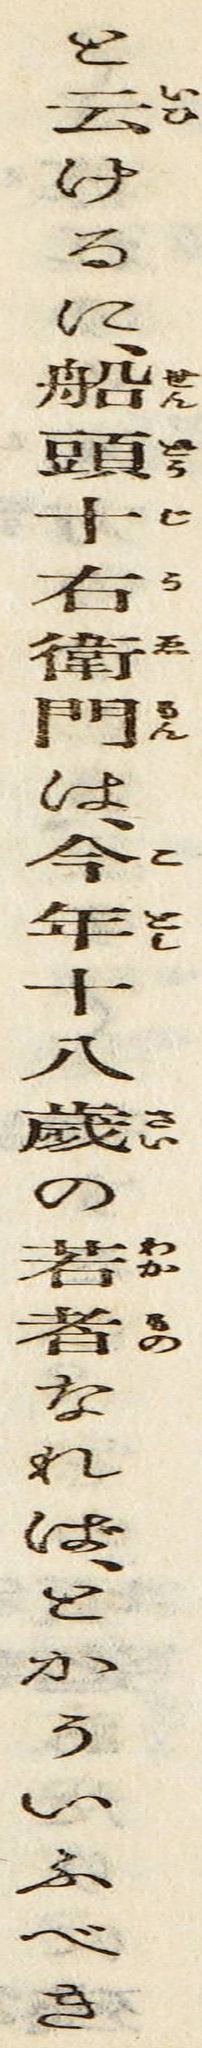と云けるに、船頭十右衛門は、今年十八歳の若者なれば、とかういふべき
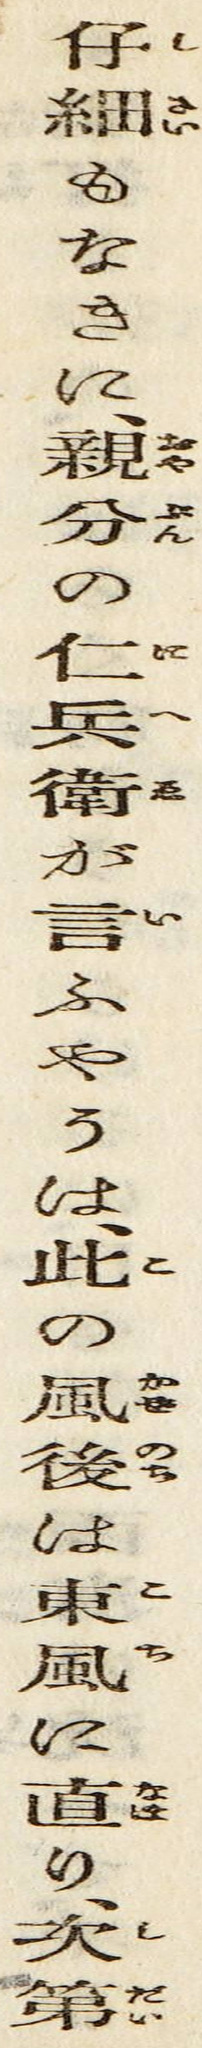仔細もなきに、親分の仁兵衛が言ふやうは、此の風後は東風に直り、次第
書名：日本漂流譚
